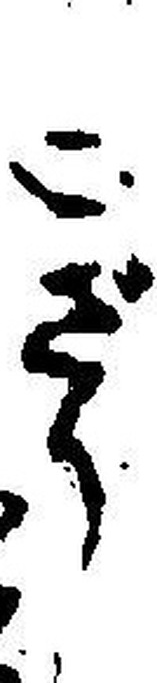こざり
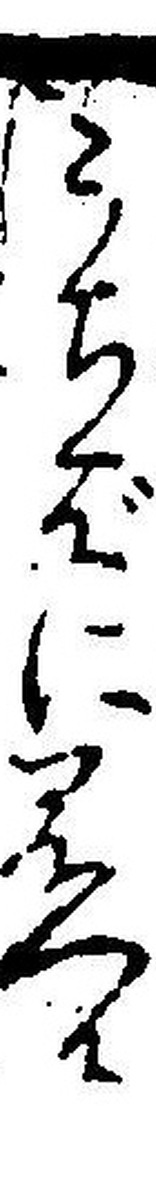うちばに見へる
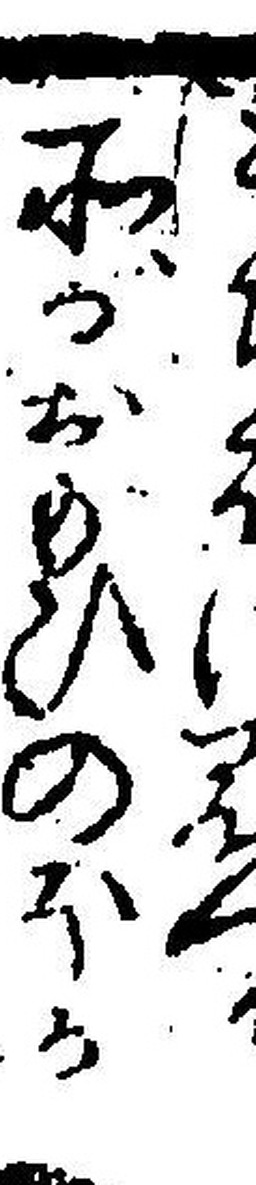所がおもひのほか
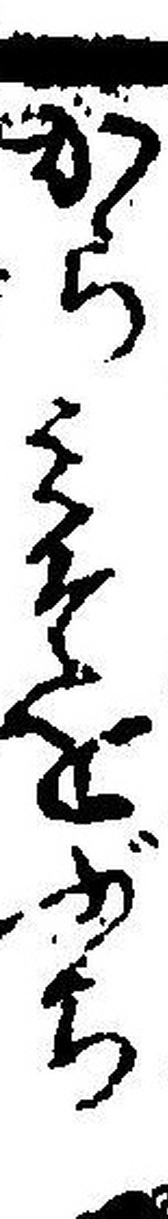からみそをぶち
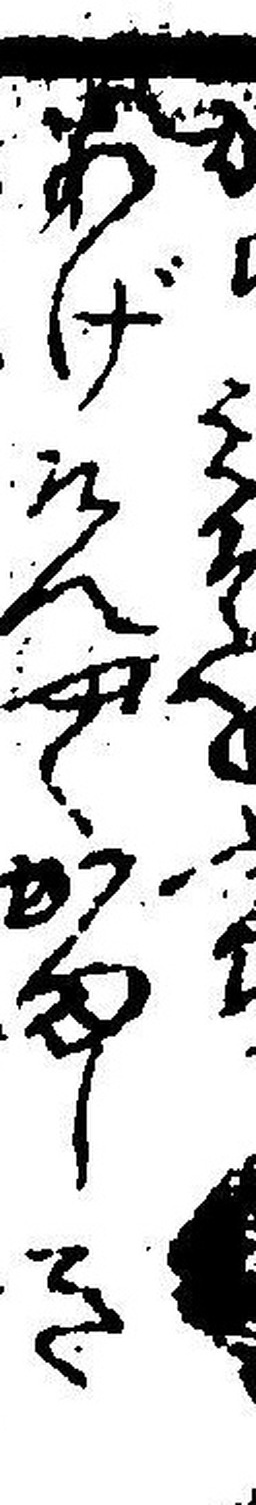あげけんやくかましき
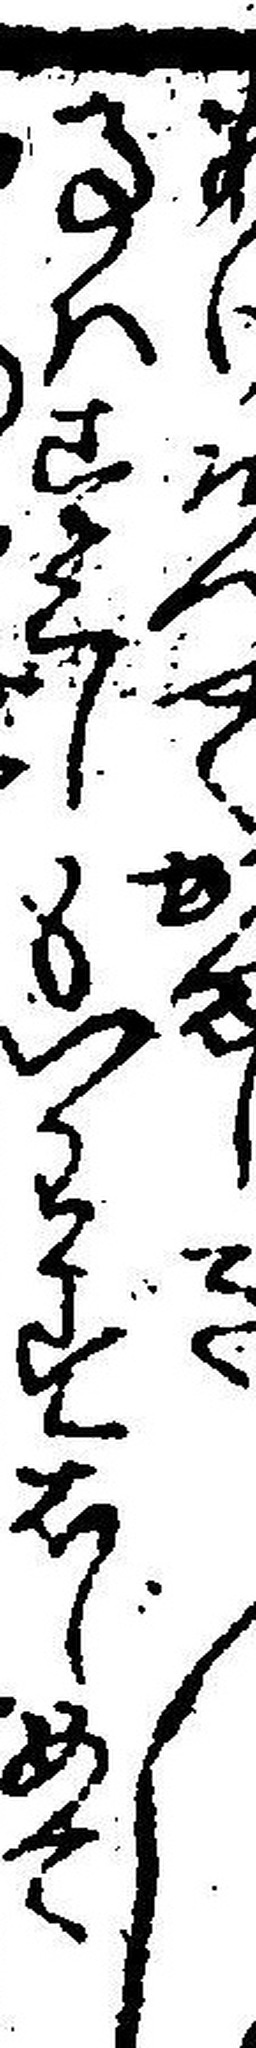ことはすこしもいわすはじめて
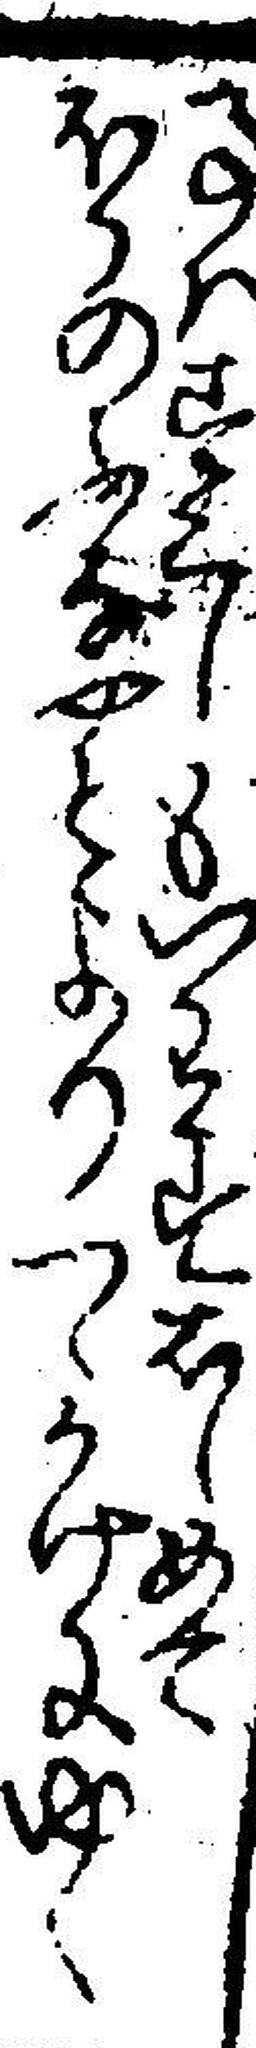ほりのふなやとよりつゝかけにゆく

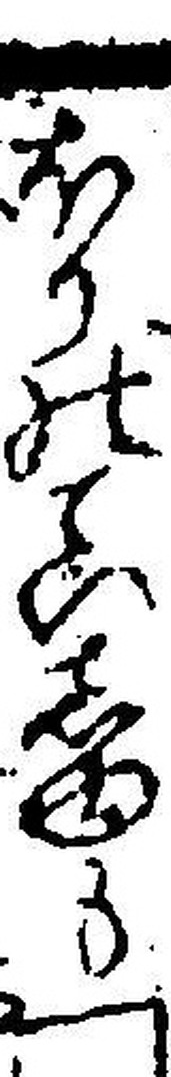ほりのていしゆも
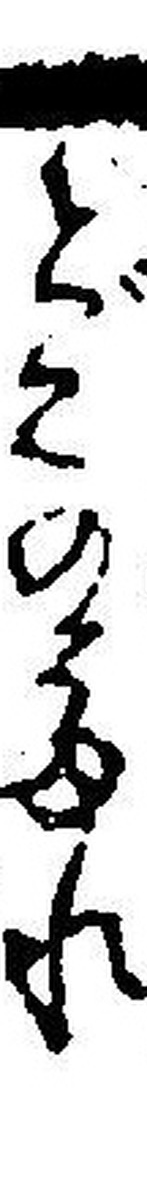どこのたれ
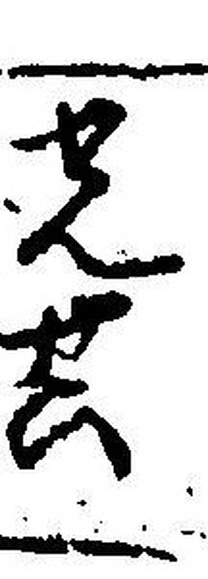せんせい
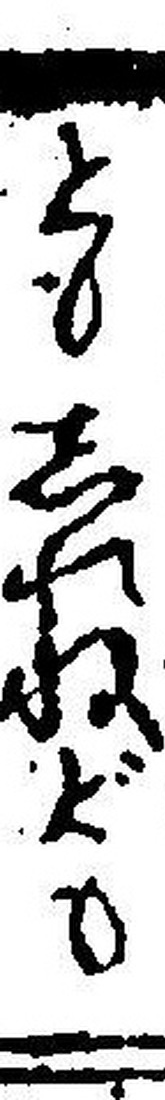ともしれねども
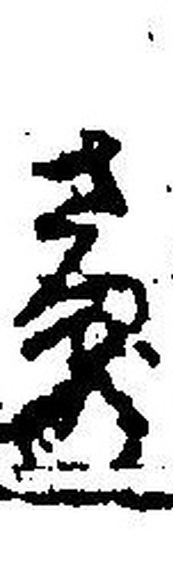さまの
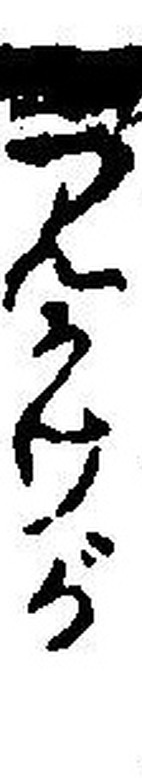見かけが
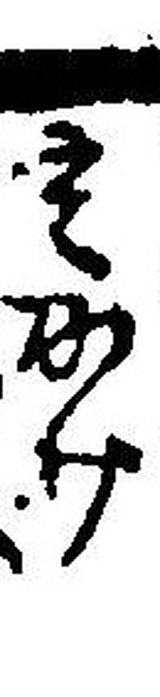みかけ
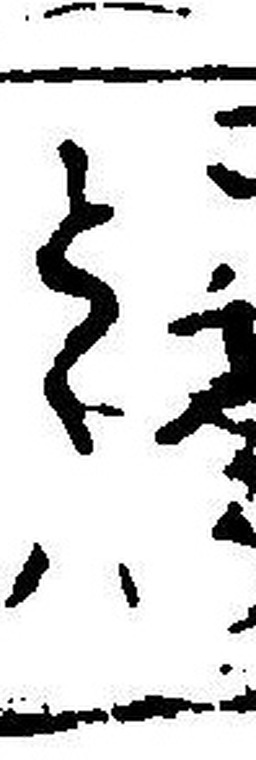とくは
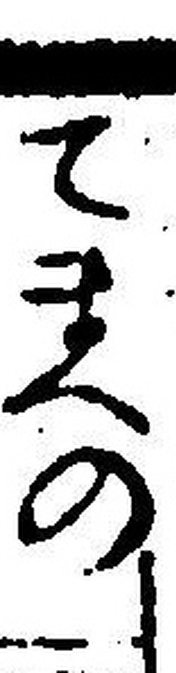てまへの
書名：間違狐之女郎買 / 市場通笑作
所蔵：東京大学総合図書館 General Library in the University of Tokyo, JAPAN
